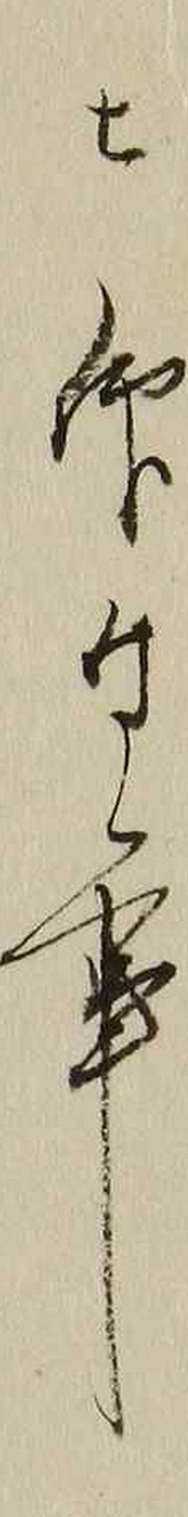被仰付候事
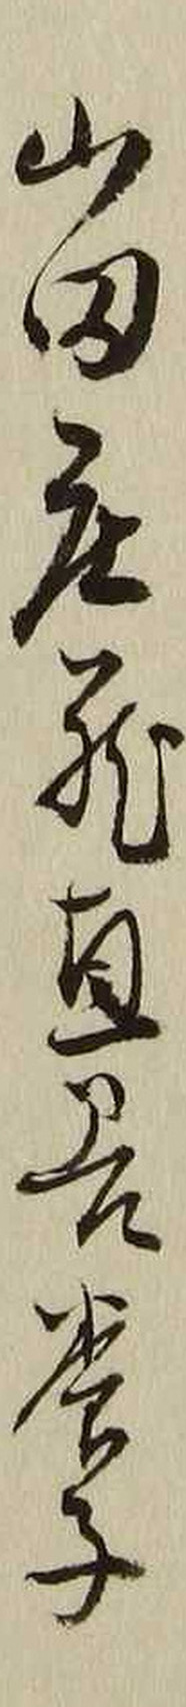山田庄蔵直善養子
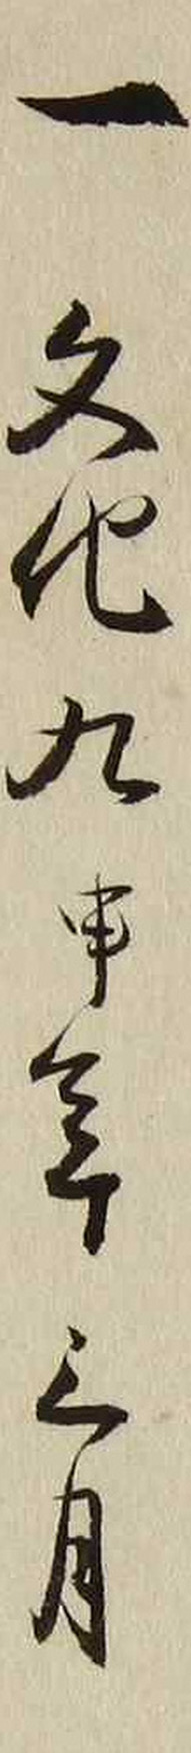一文化九申年三月
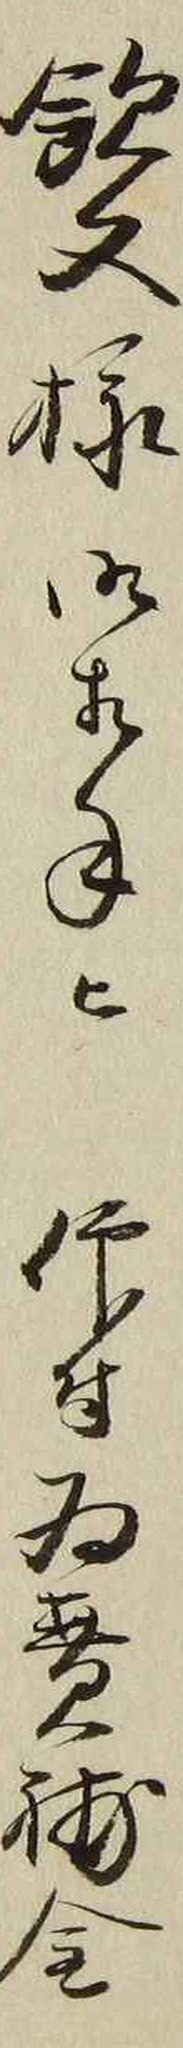欽文様御相手被仰付為費補金
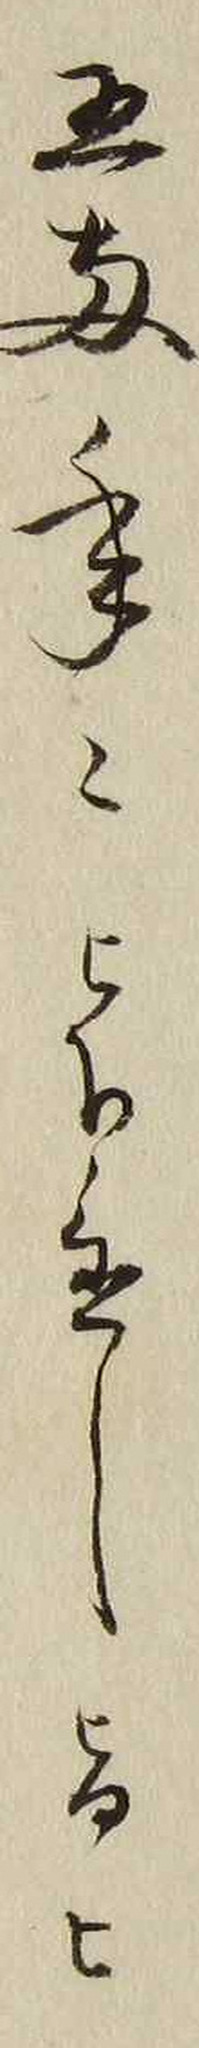五両年々被下置旨被
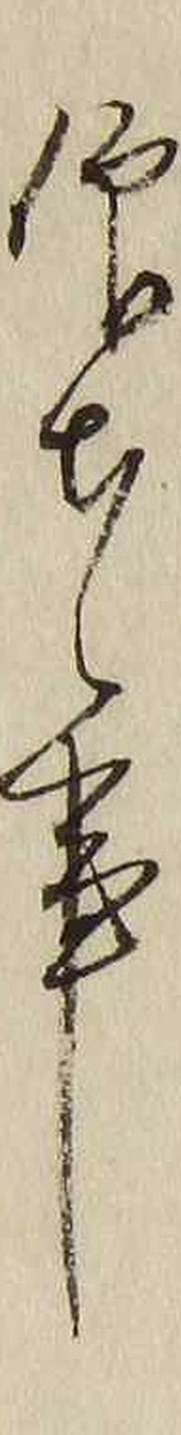仰出候事
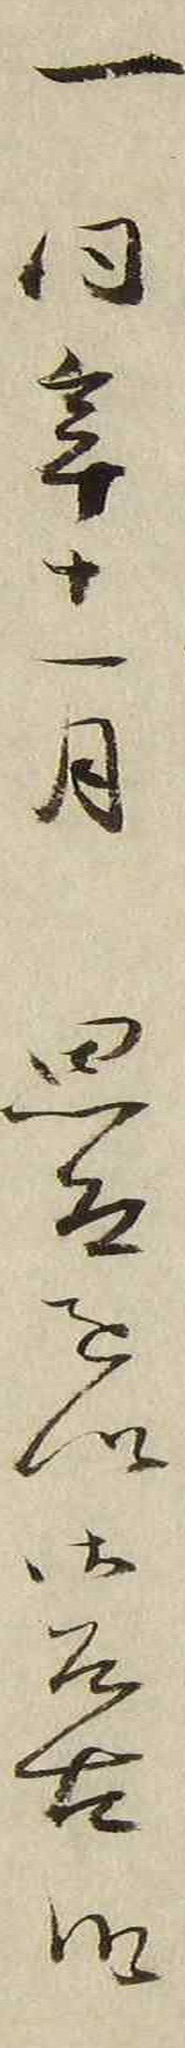一同年十一月思召を以御召古御
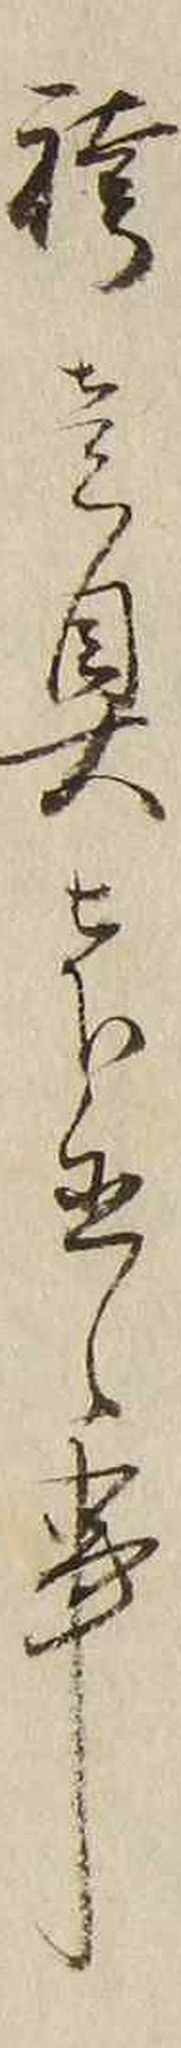袴壱具被下置候事

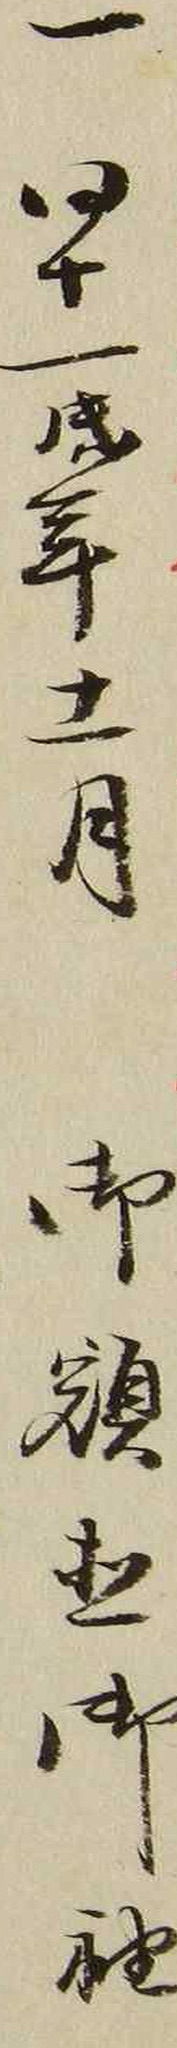一同十一戌年十一月御額直御袖
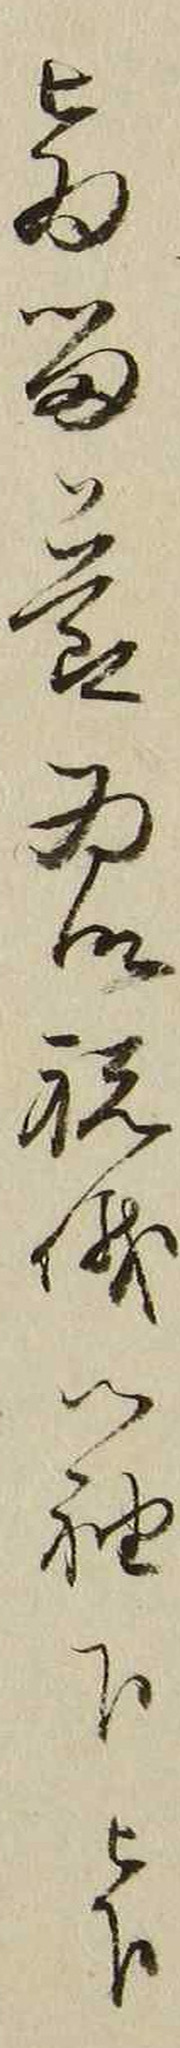被為留候節為御祝儀御袖下被下
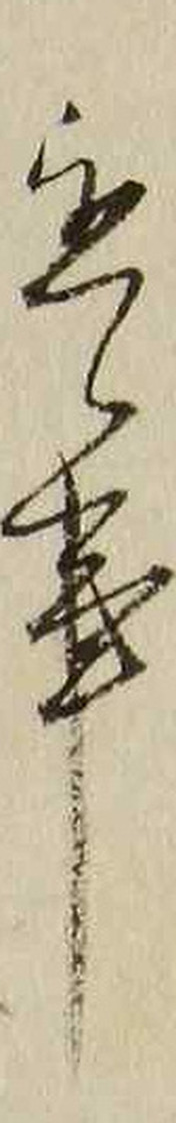置候事
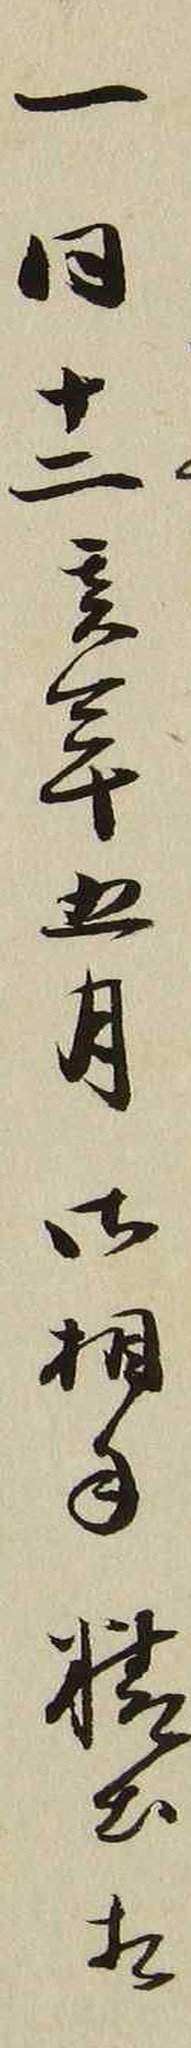一同十二亥年五月御相手精出相
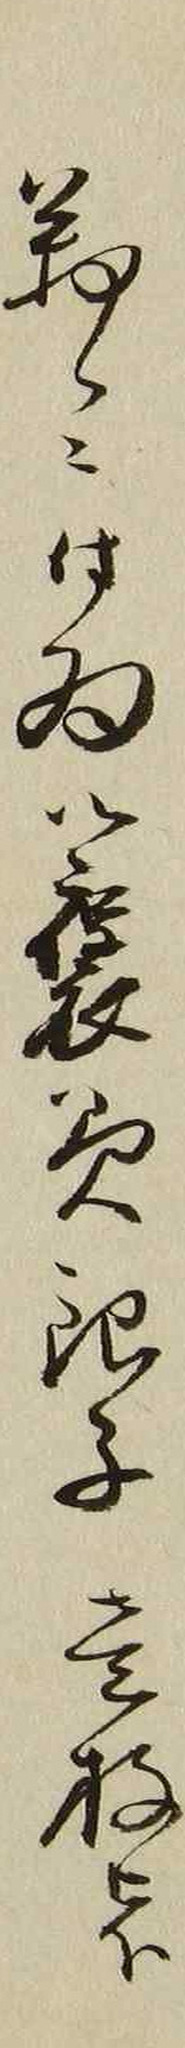勤候に付為御褒美銀子壱枚被下
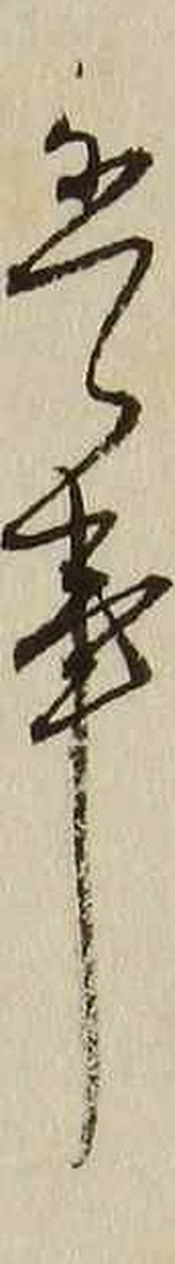置候事
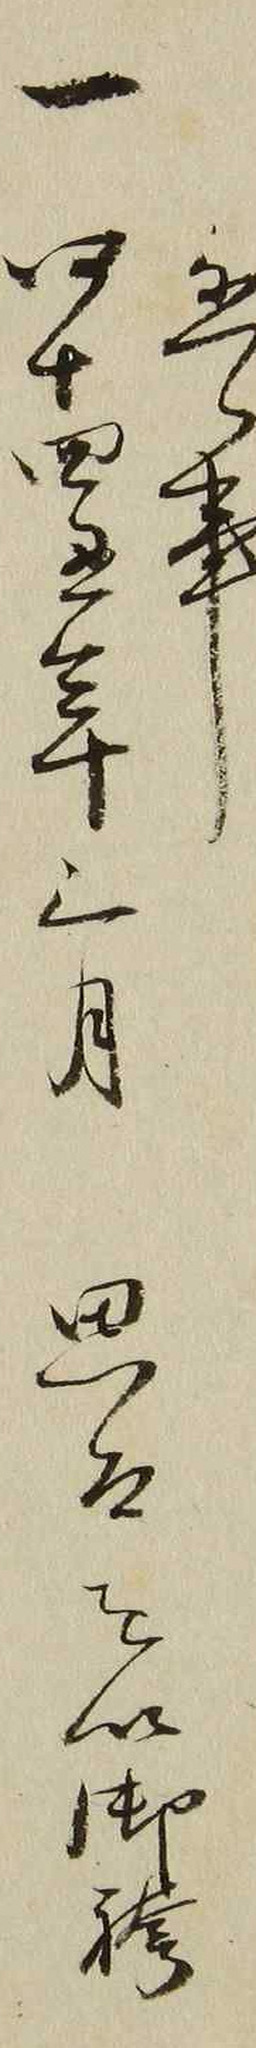一同十四丑年三月思召を以御袴
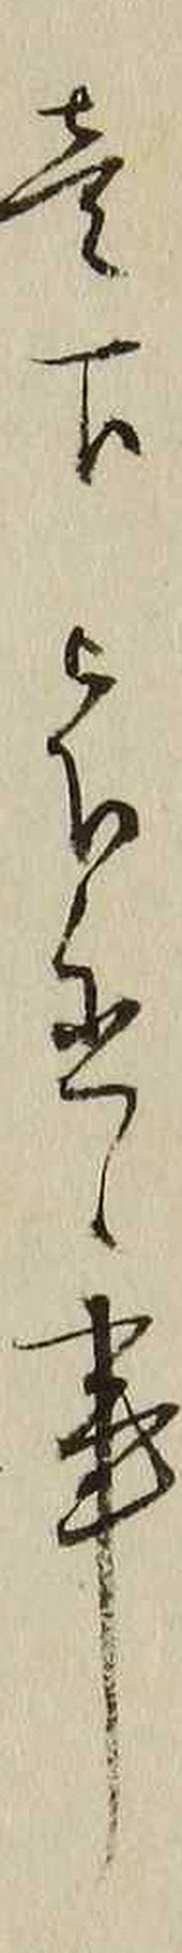壱下被下置候事
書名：諸士系譜　巻之292　き之部1
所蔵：会津若松市立会津図書館
